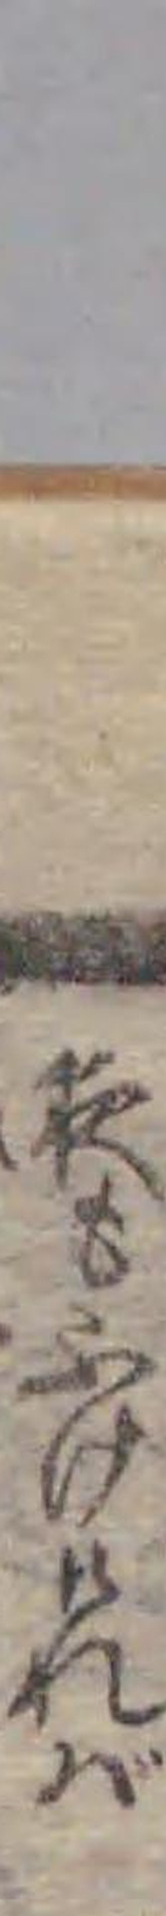夜もふけければ
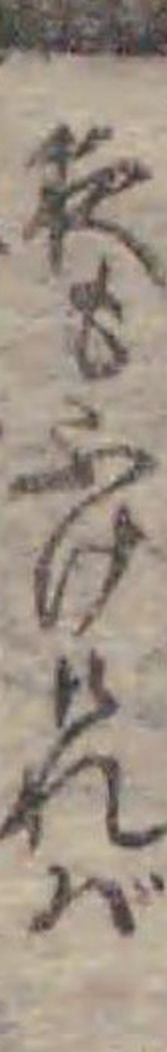夜もふけければ
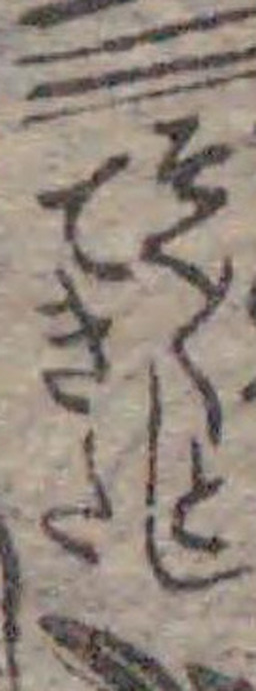てきた
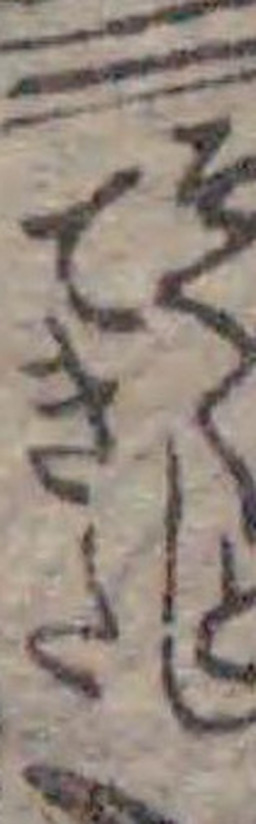てきた
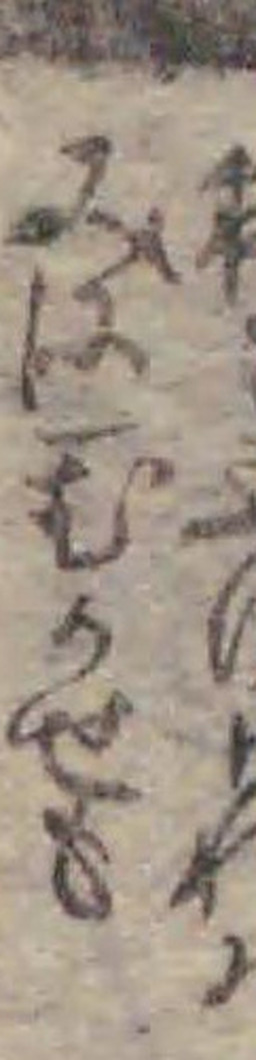みにしむかせも
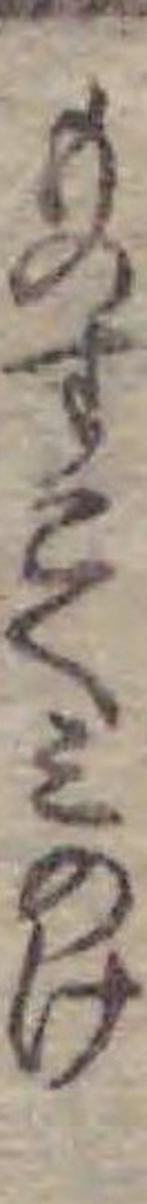ものすこくみのけ
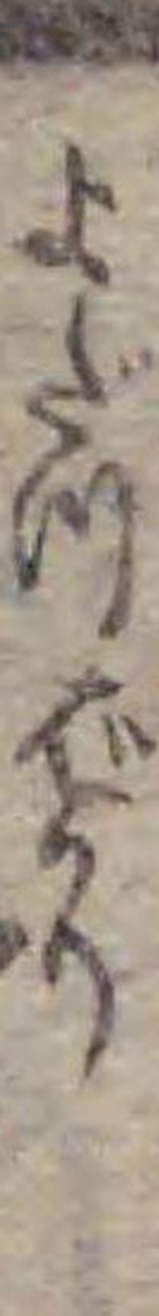よだつばかり
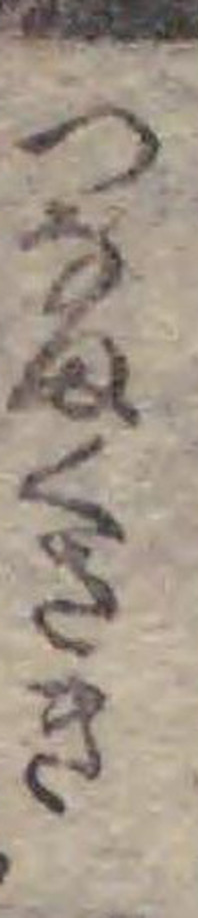つなまくさき
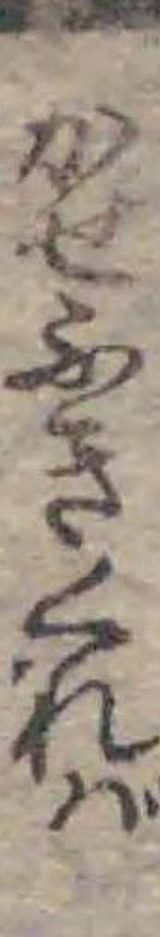かせふきくれば
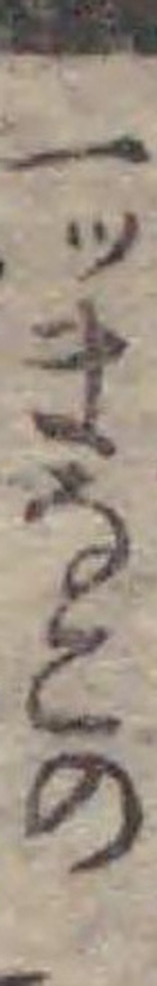一つまなこの
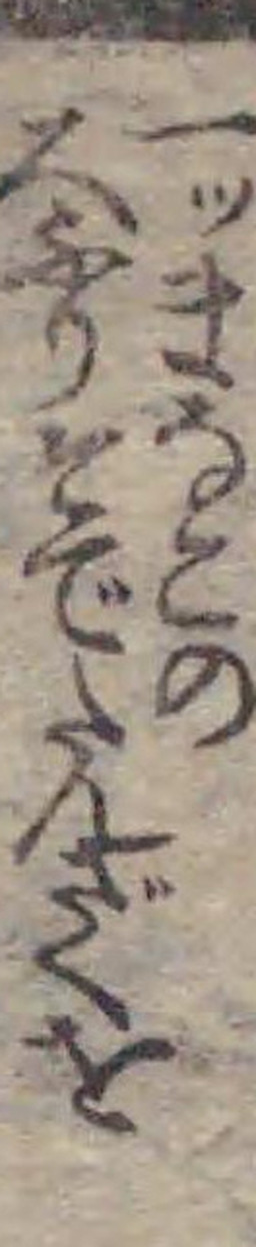大ふりそでたんざくを
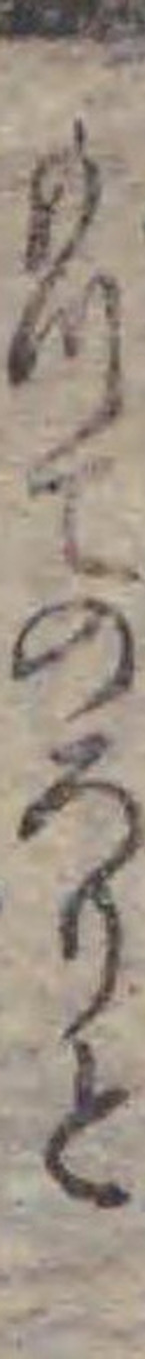もつてのろりと
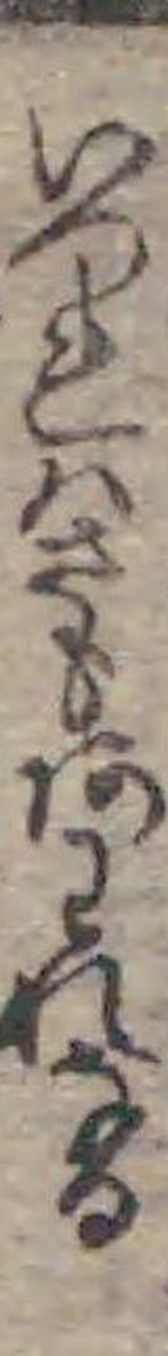いつれはさもあわれなる
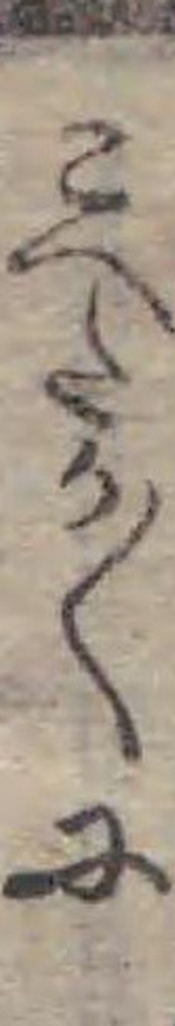こへたか〳〵に
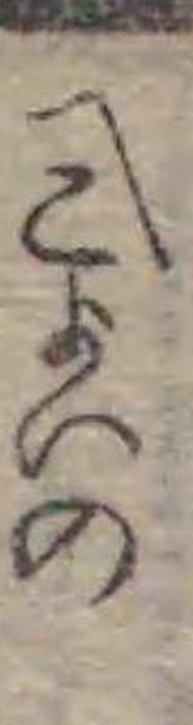〽こよいの
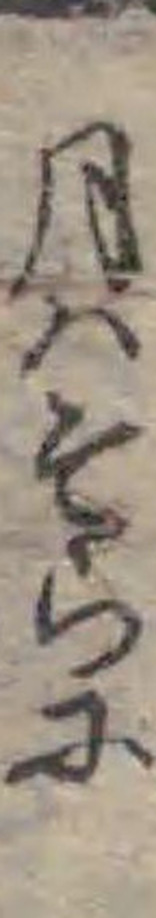月はそらに
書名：歌の化物一寺再興 : 2巻
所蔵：国立国会図書館 National Diet Library, JAPAN
